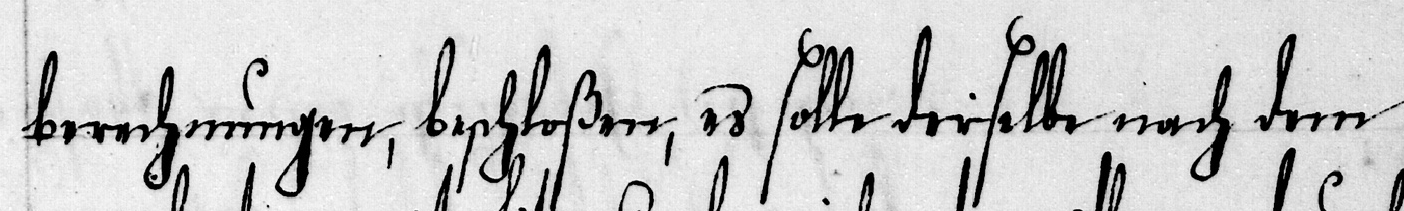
beschloßen, es solle derselbe nach dem
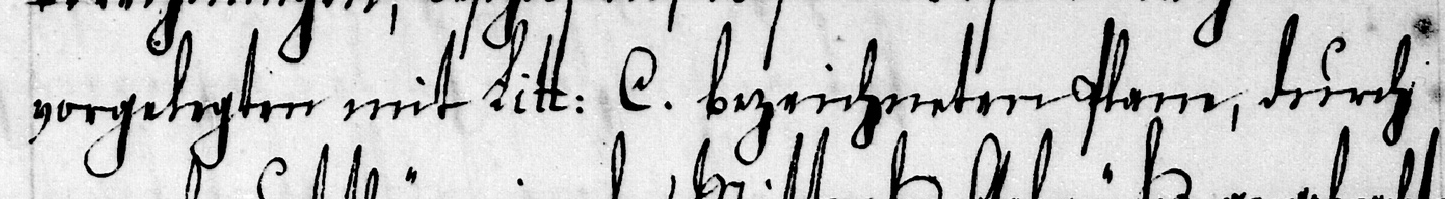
vorgelegten mit Litt: C. bezeichneten Plane, durch
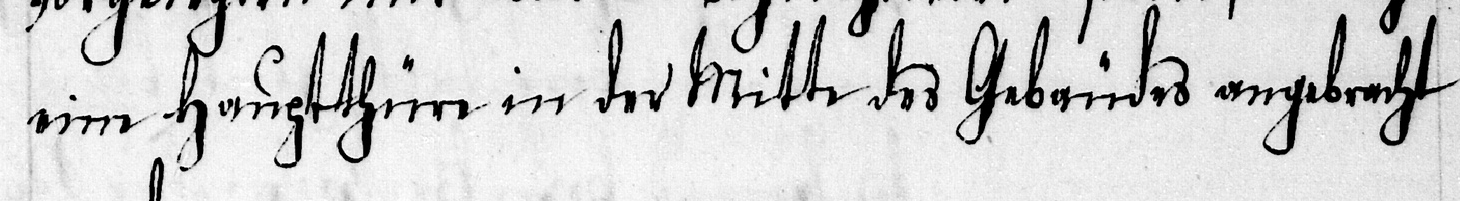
eine Hauptthüre in der Mitte des Gebäudes angebracht
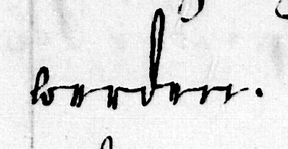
werden.
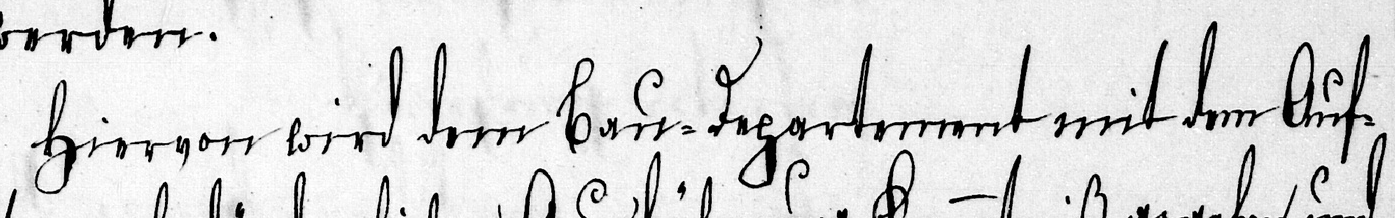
Hiervon wird dem Bau-Departement mit dem Auf¬
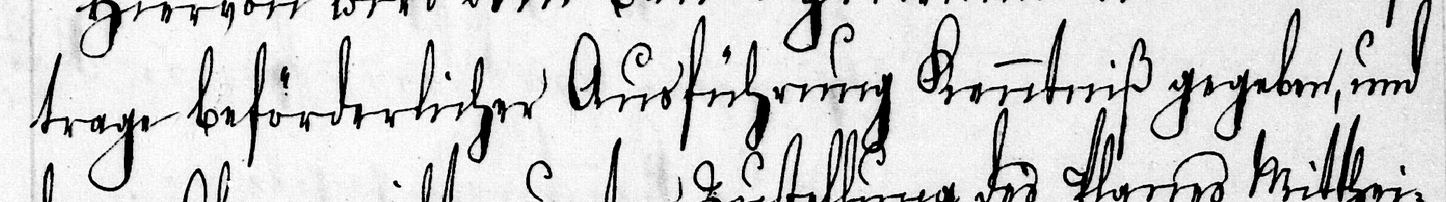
trage beförderlicher Ausführung Kenntniß gegeben, und
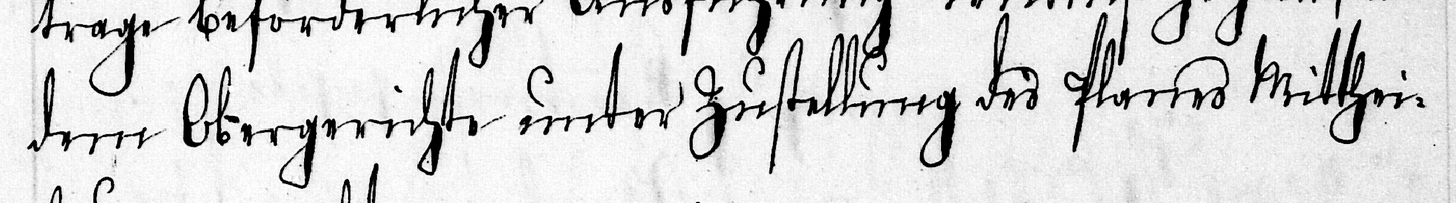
dem Obergerichte unter Zustellung des Planes Mitthei¬
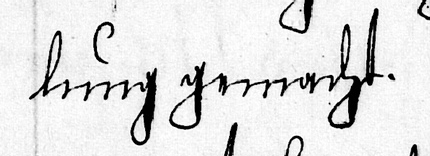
lung gemacht.
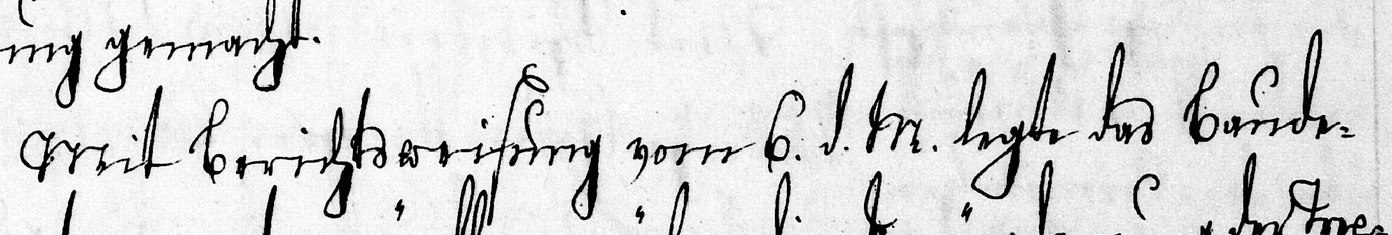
Mit Berichtsweisung vom 6. d. M. legte das Baude¬
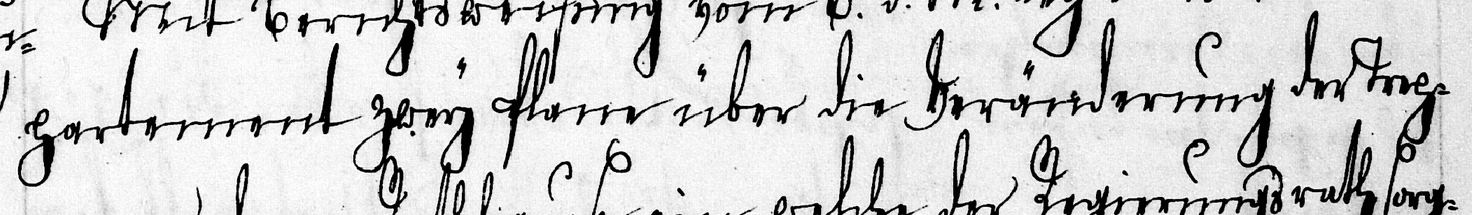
partement zwey Plane über die Veränderung der Trep¬
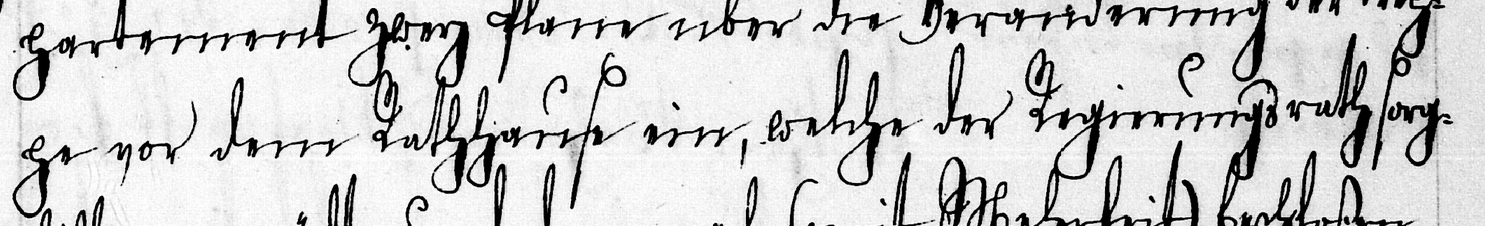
pe vor dem Rathhause ein, welche der Regierungsrath sorg¬
